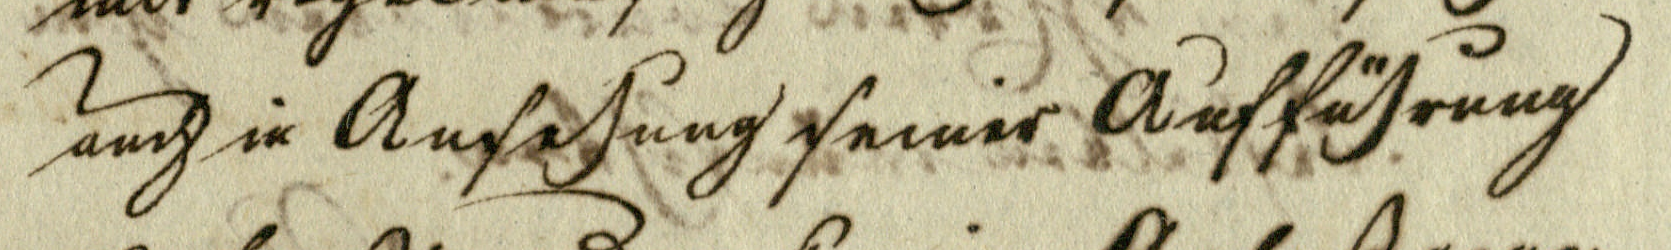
auch in Ansehungseiner Aufführung
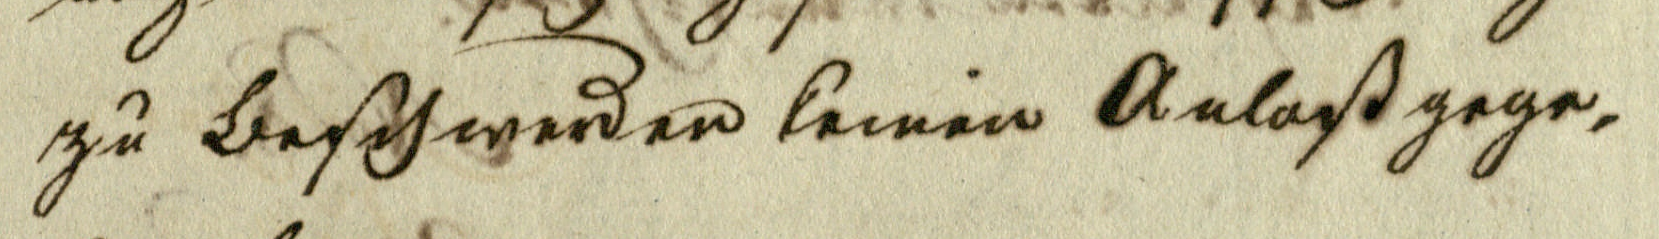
zu Beschwerden keinen Anlaß gege¬
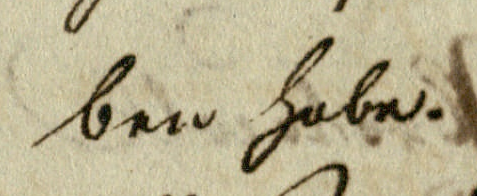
ben habe.
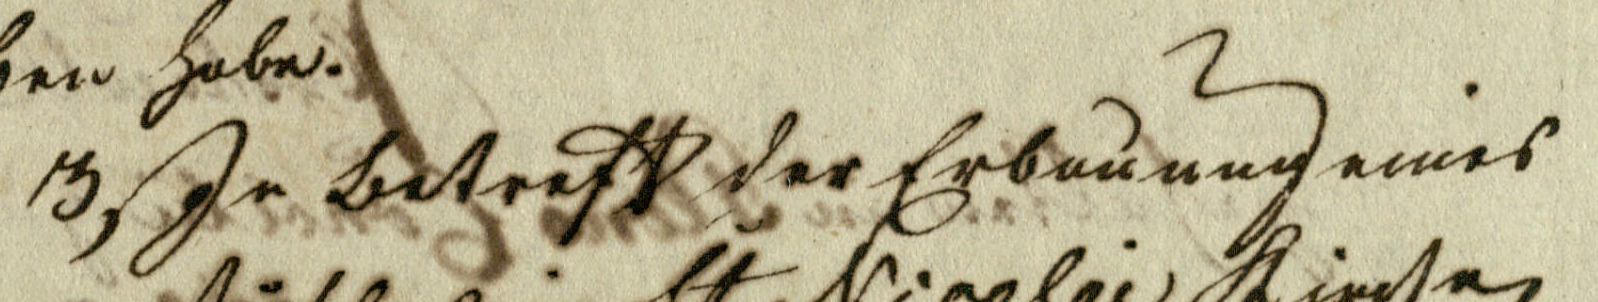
3, In Betreff der Erbauung eines
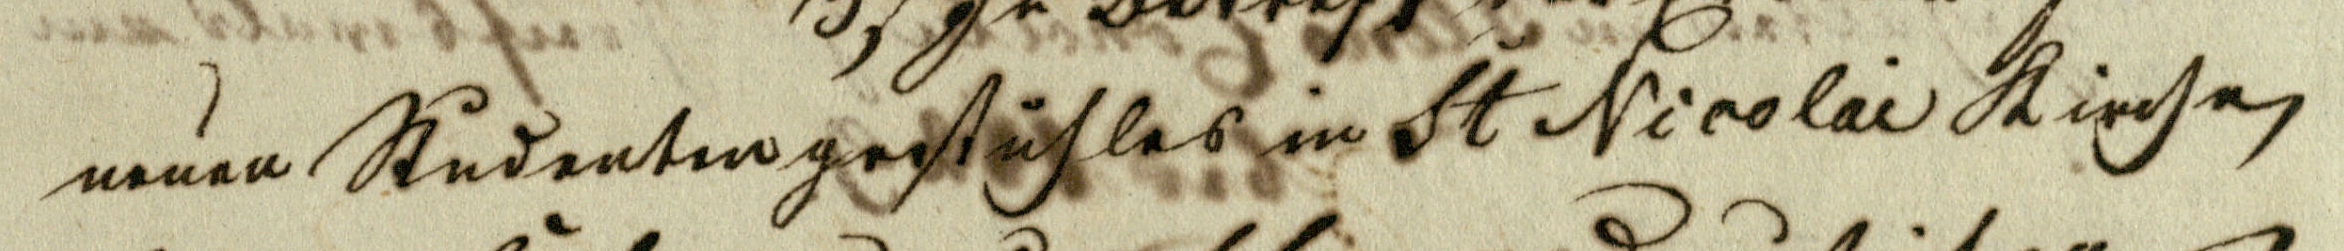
neuen Studentengestühles in St Nicolai Kirche
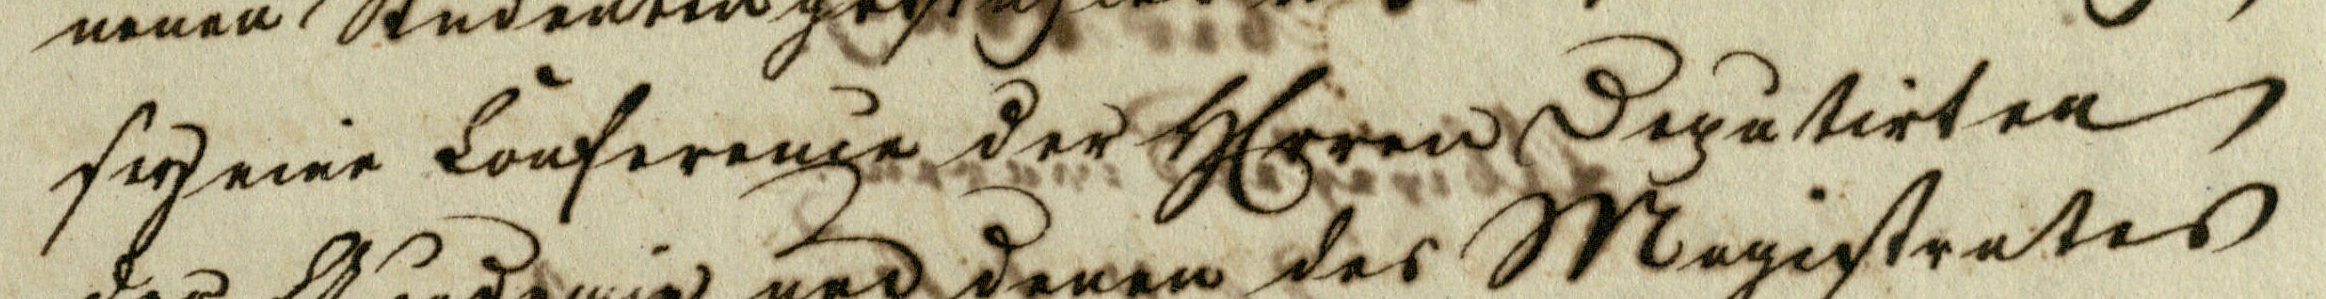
sei eine Conference der Herren Deputirten
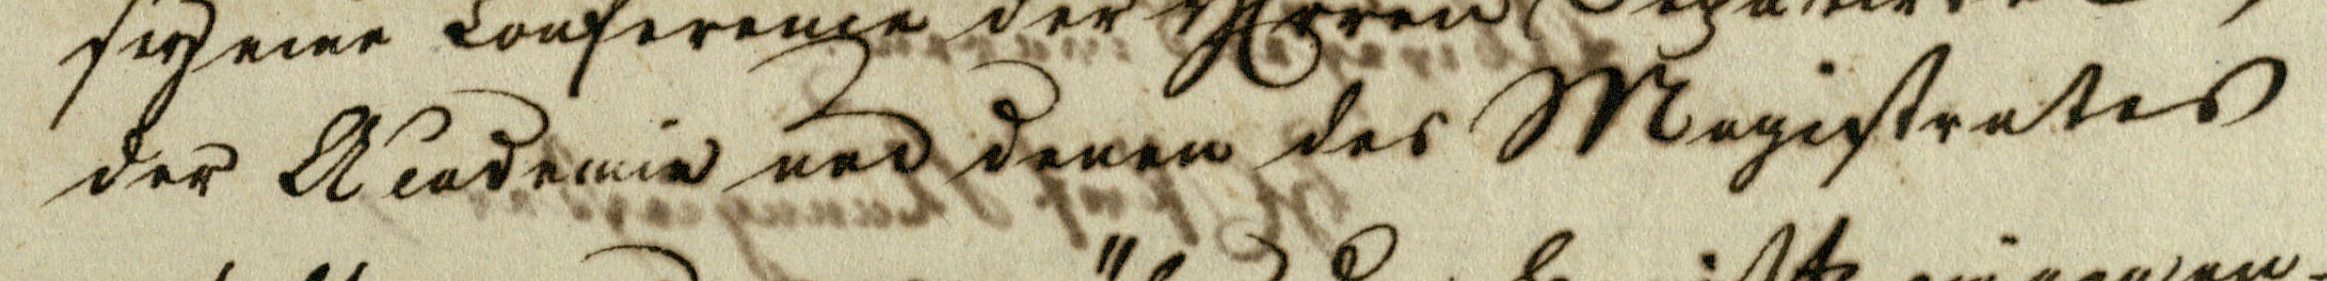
der Academie und denen des Magistrates
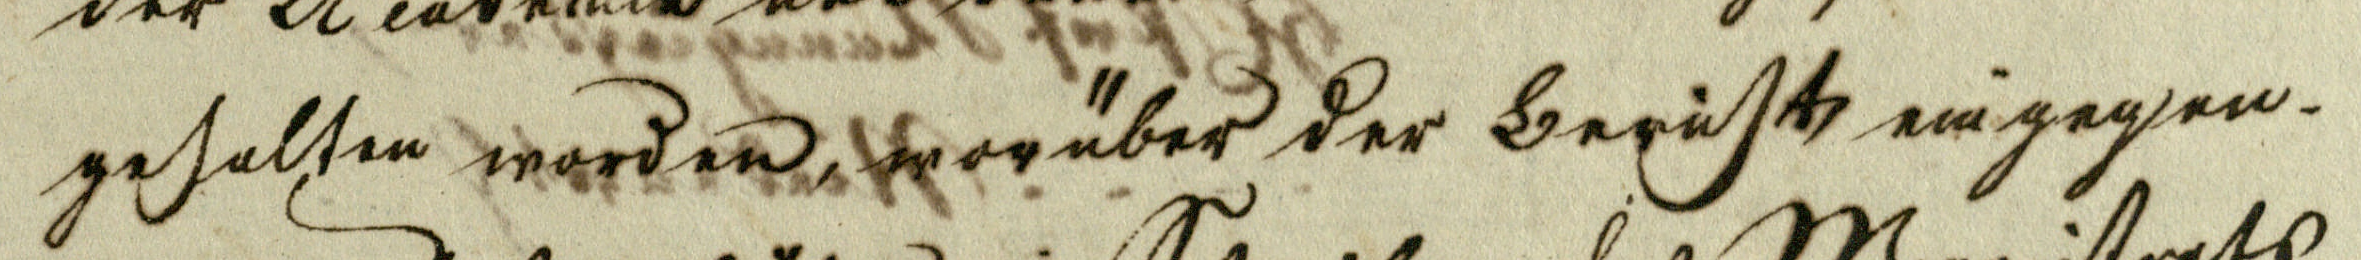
gehalten worden, worüber der Bericht eingegan¬
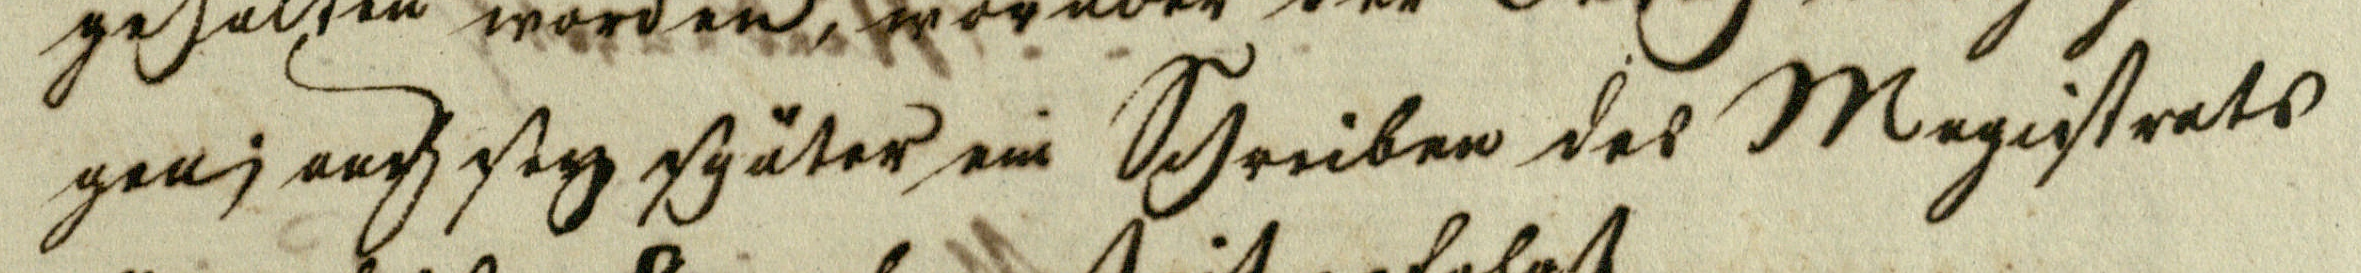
gen; auch sey später ein Schreiben des Magistrats
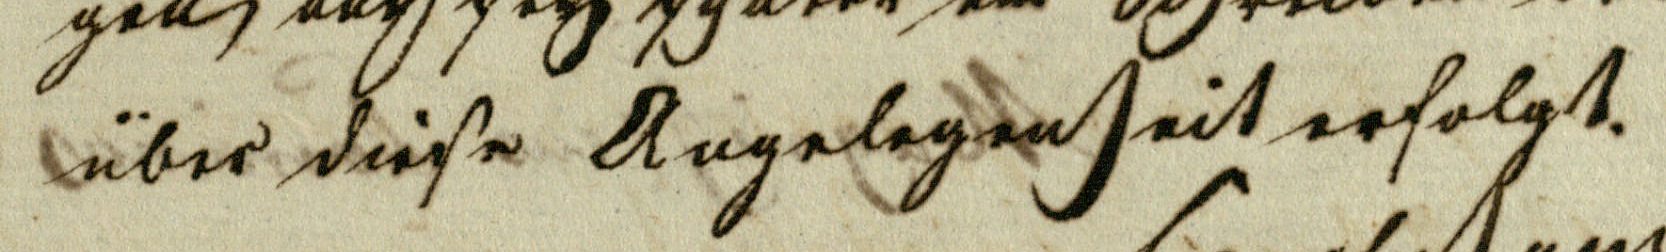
über diese Angelegenheit erfolgt.
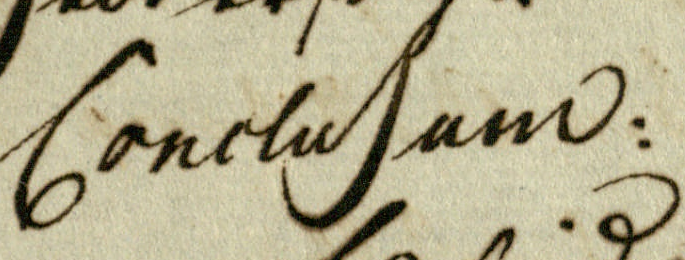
Conclusum:
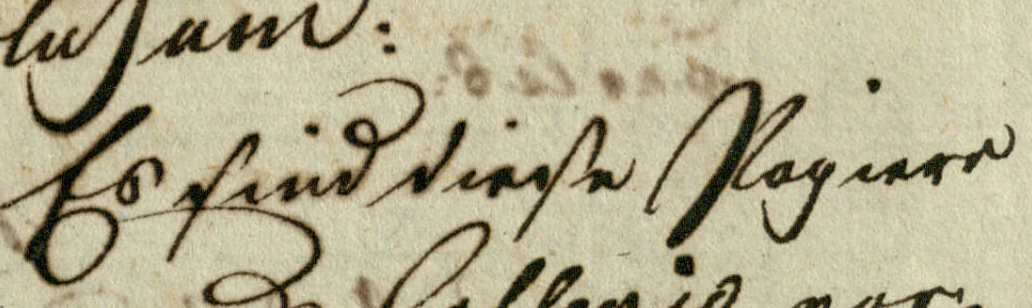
Es sind diese Papiere
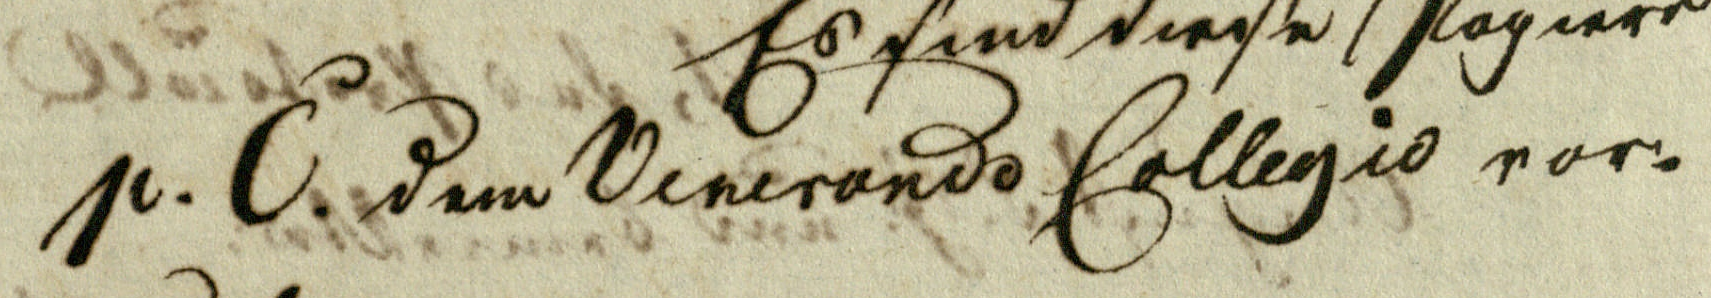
p. C. dem Venerando Collegio vor¬
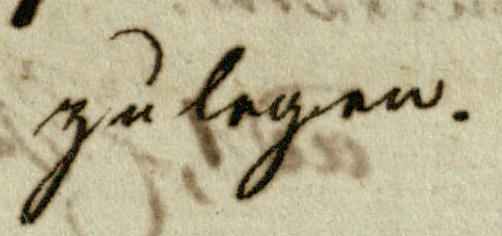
zu legen.
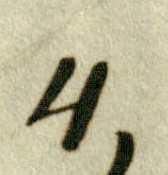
4,
